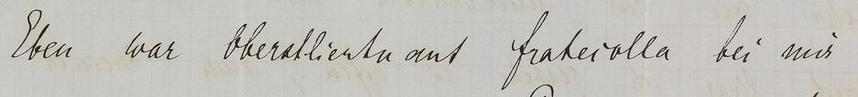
Eben war Oberstlieutnant Fratecolla bei mir der
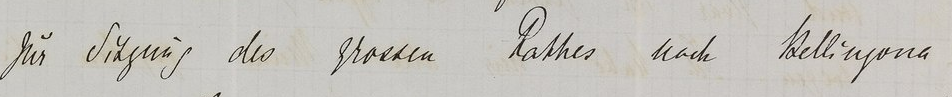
zur Sitzung des Grossen Rathes nach Bellinzona
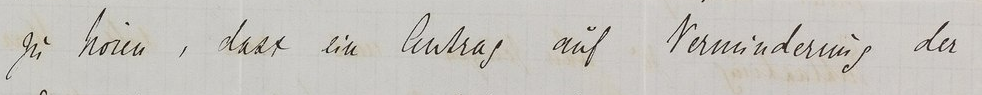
zu hören, dass ein Antrag auf Verminderung der
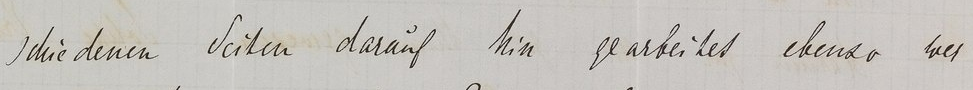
schiedenen Seiten darauf hin gearbeitet ebenso wer-
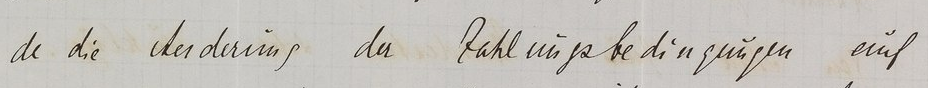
de die Änderung der Zahlungsbedingungen auf
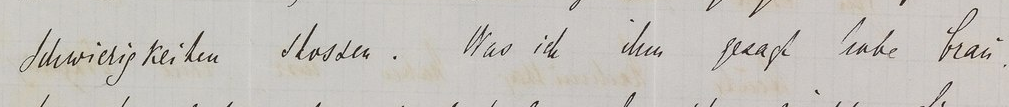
Schwierigkeiten stossen. Was ich ihm gesagt habe brau-
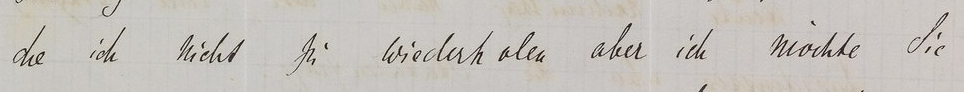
che ich nicht zu wiederholen aber ich möchte Sie
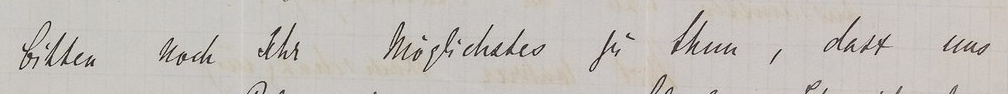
bitten noch Ihr Möglichstes zu thun, dass uns
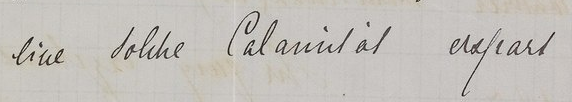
eine solche Calamität erspart
